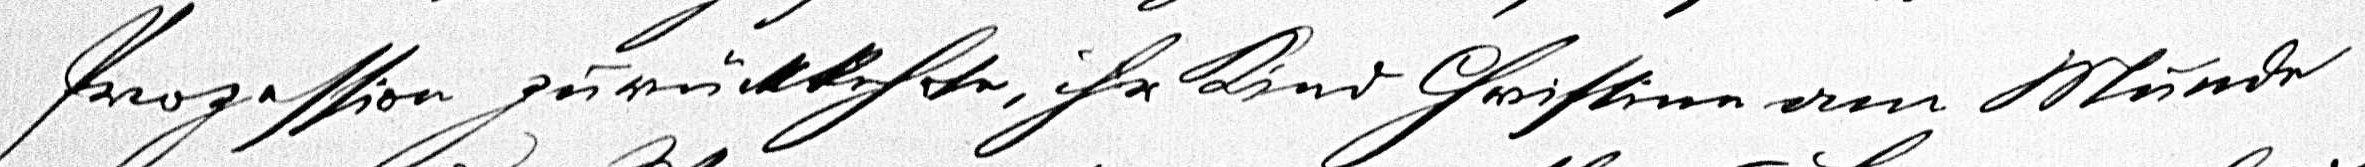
Prozession zurückkehrte, ihr Kind Christine am Munde
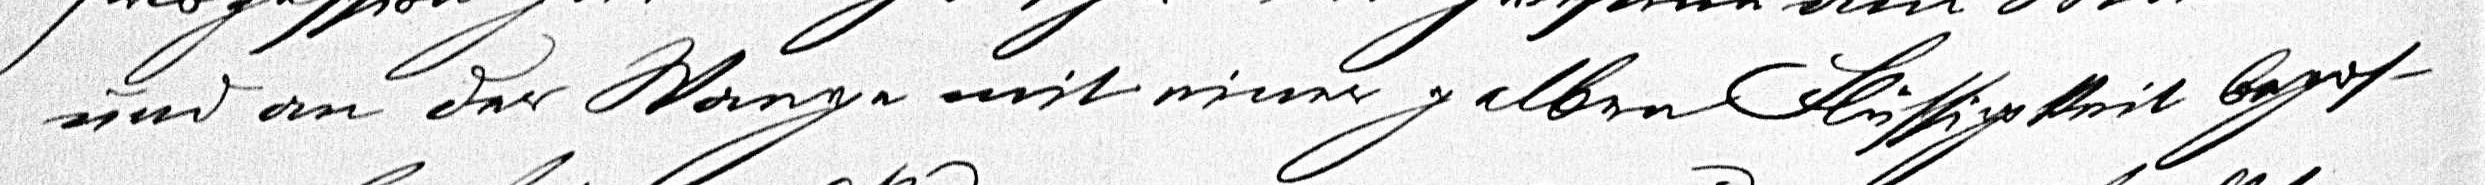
und an der Wange mit einer gelben Flüßigkeit begos¬
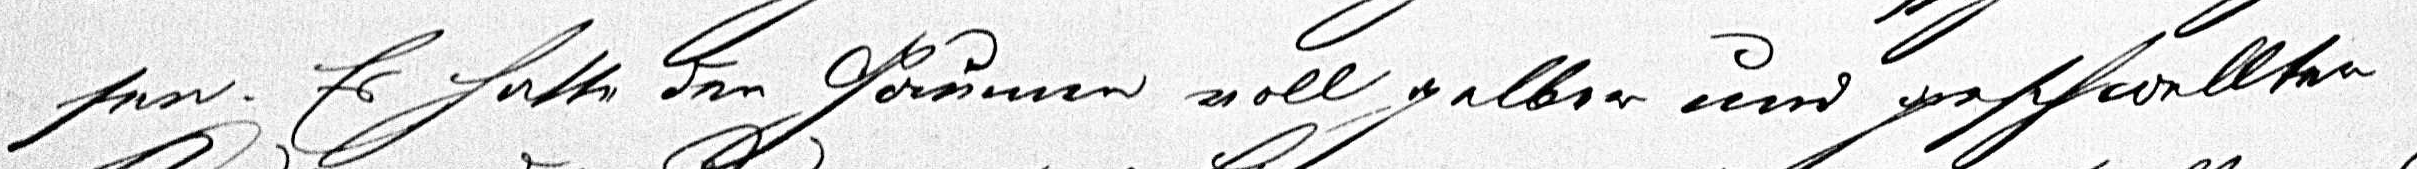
sen. Es hatte den Gaumen voll gelber und geschwellten
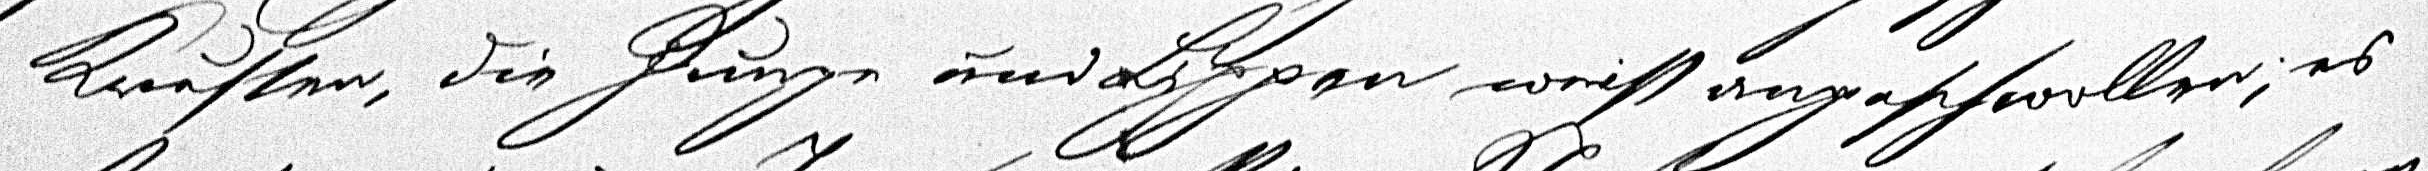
Krusten, die Zunge und Lippe weiß angeschwollen; es
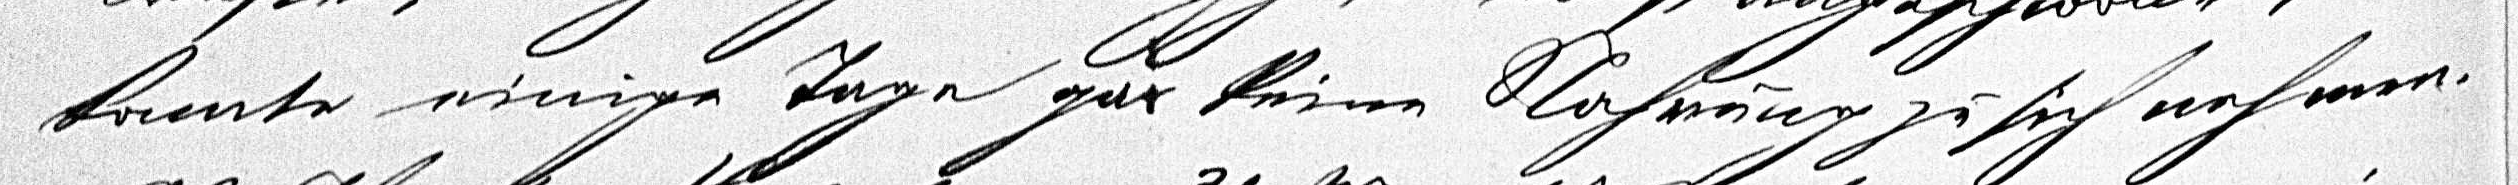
kannte einige Tage gar keine Nahrung zu sich nehmen.
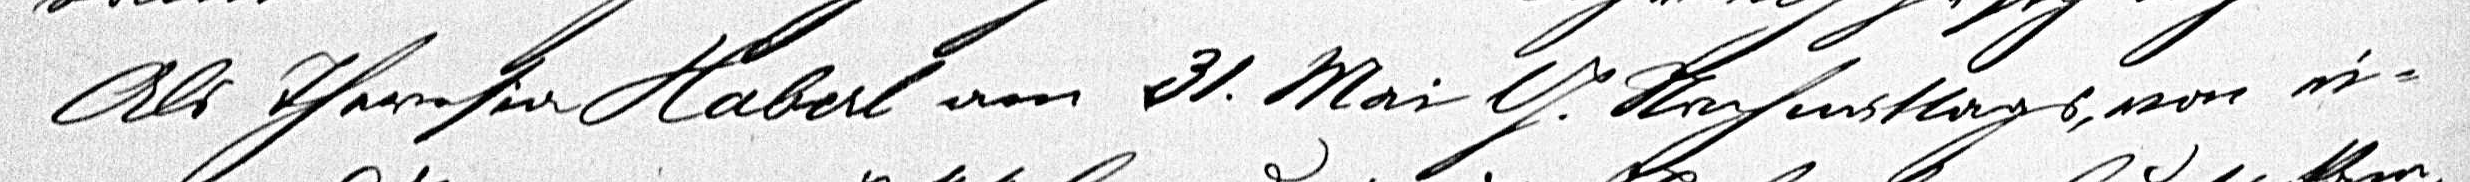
Als Theresia Haberl am 31. Mai lJ Nachmittags, von ei¬
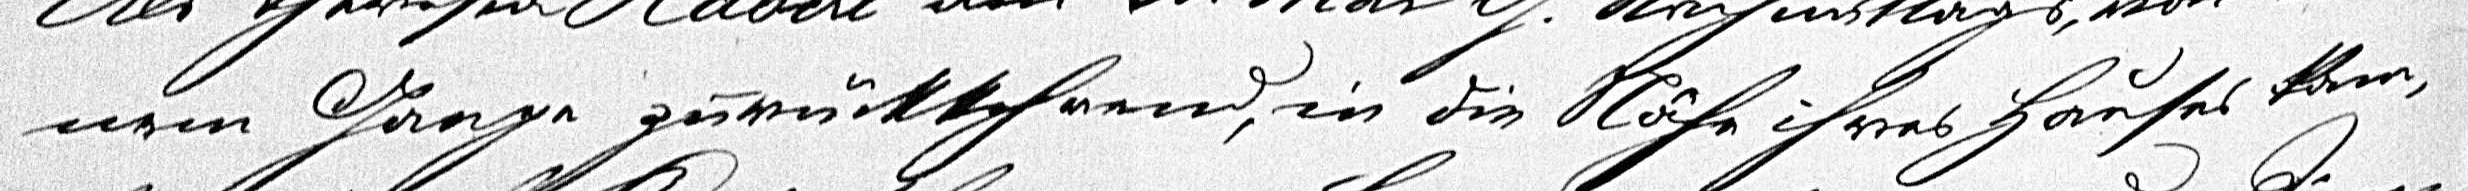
nem Gange zurückkehrend, in die Nähe ihres Hauses kam,
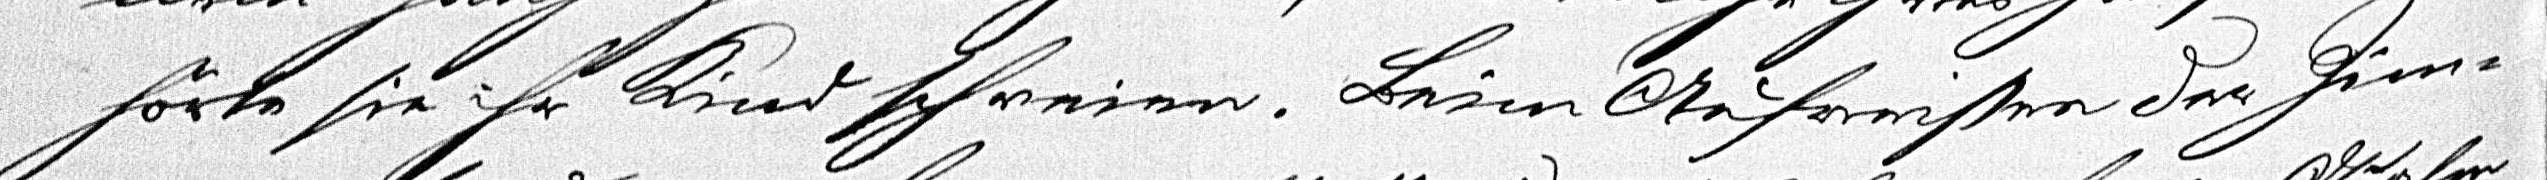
hörte sie ihr Kind schreien. Bei Aufreißen der Zim¬
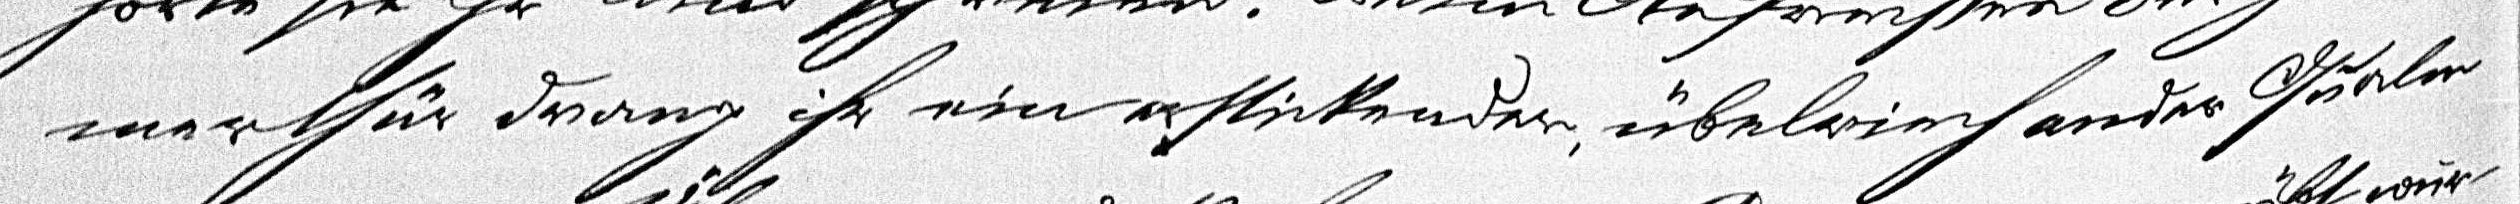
merthür drang ihr ein ersticender, übelriechender Qualen
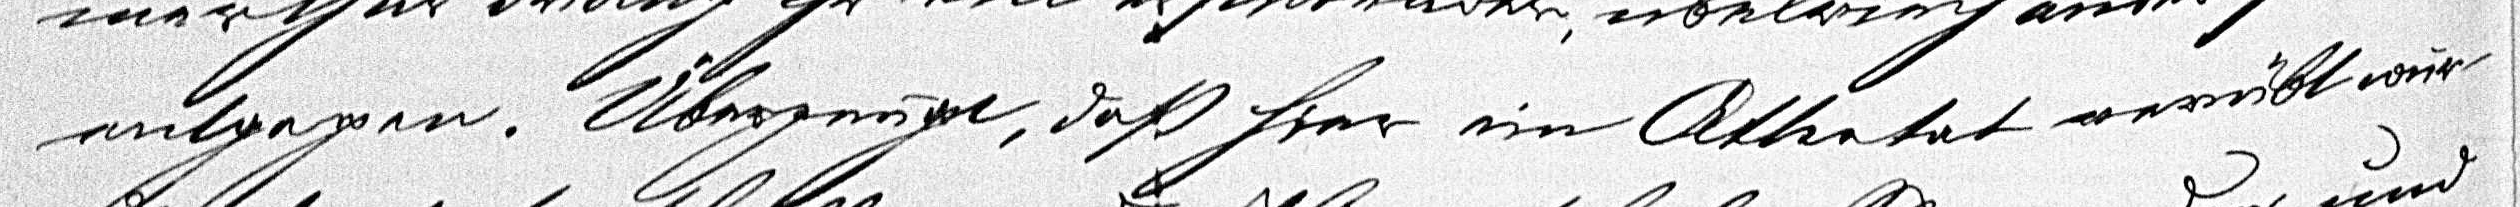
entgegen. Überzeugt, daß hier ein Attentat verübt wur¬
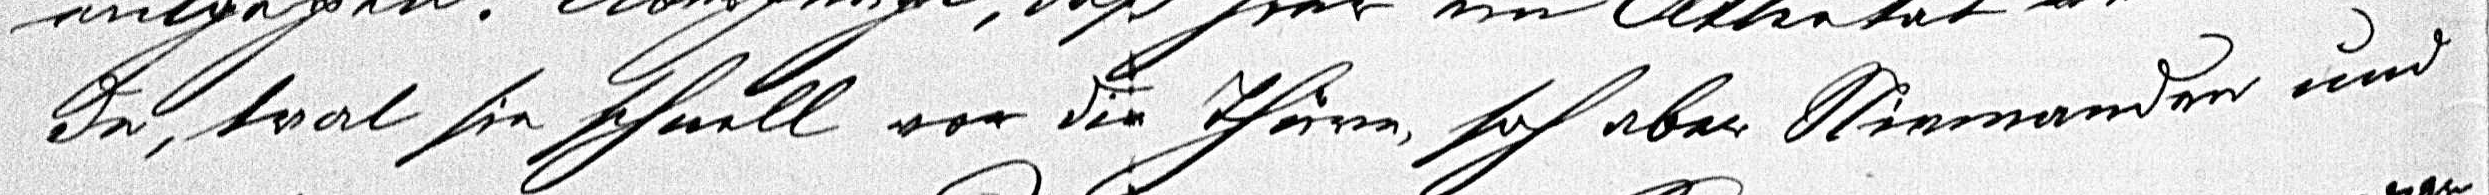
de, trat sie schnell vor die Thüre, sah aber Niemanden und
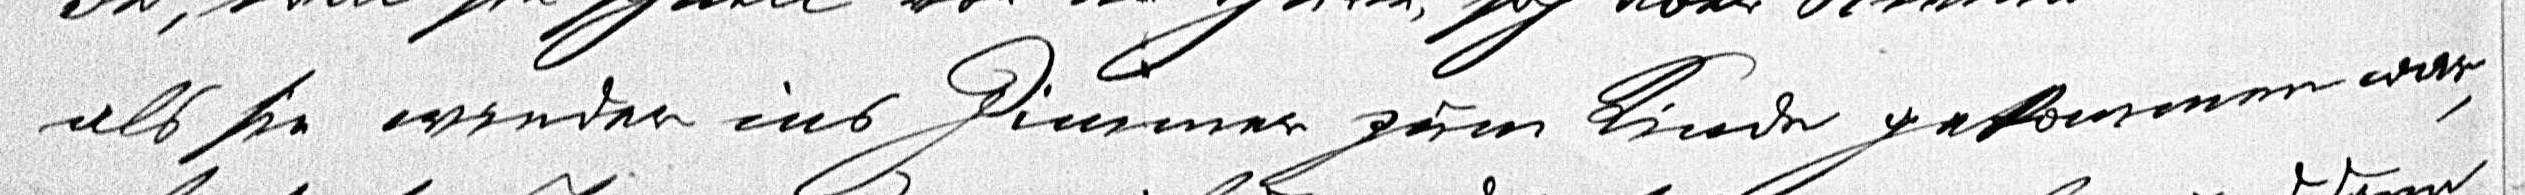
als sie wieder ins Zimmer zum Kind gekommen war,
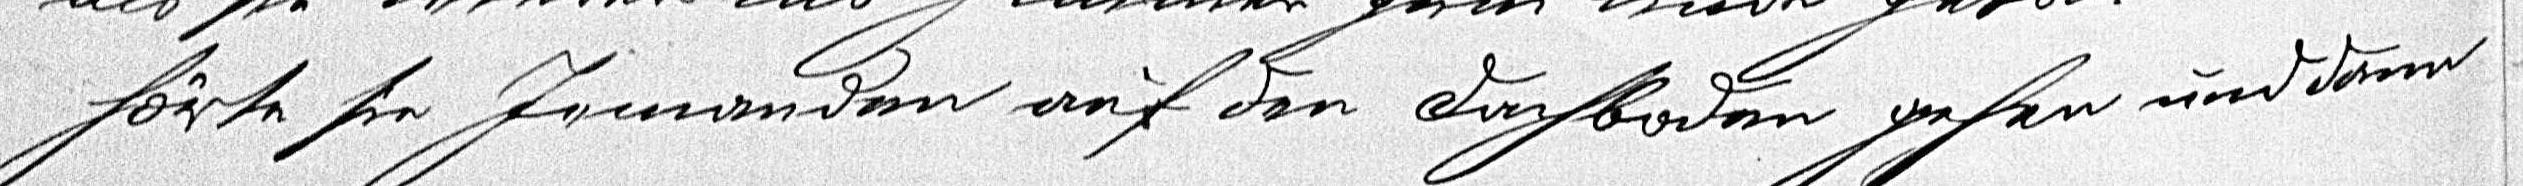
hörte sie Jemanden auf den Dachboden gehen und dann
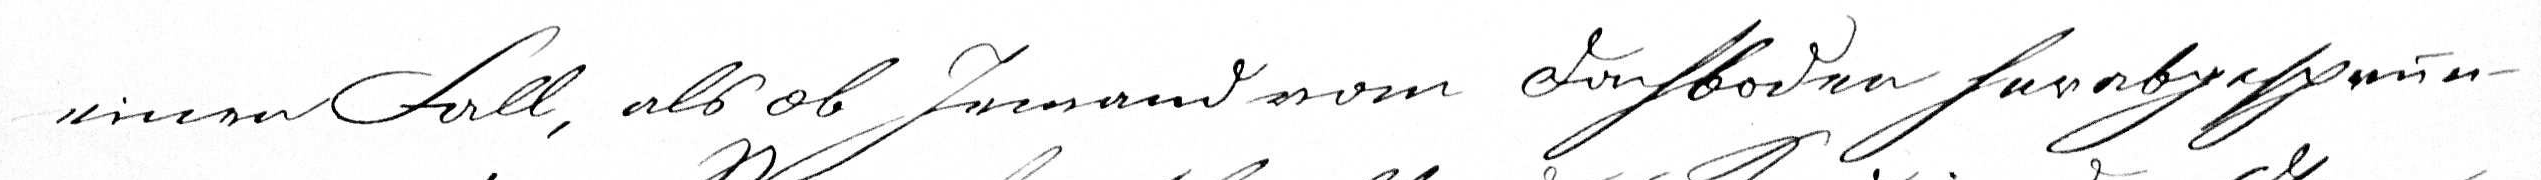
einen Fall, als ob Jemand vom Dachboden herabgesprun¬
